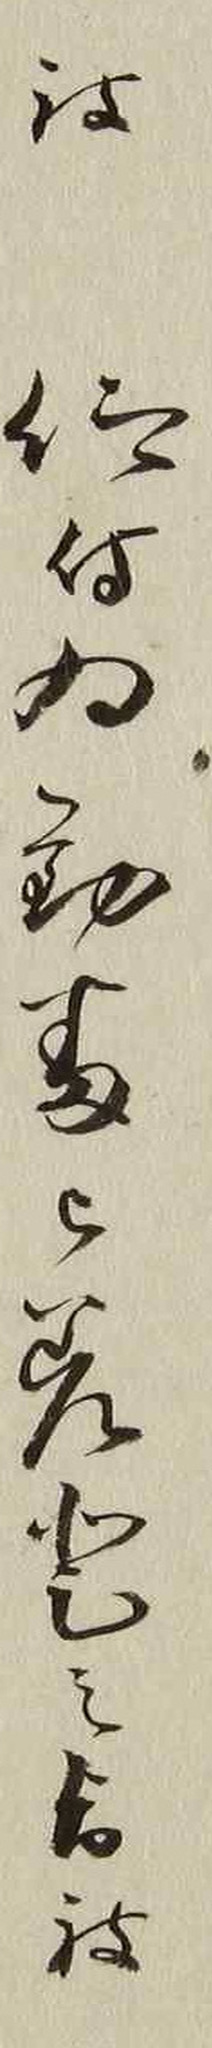被仰付為勤番被差登之旨被
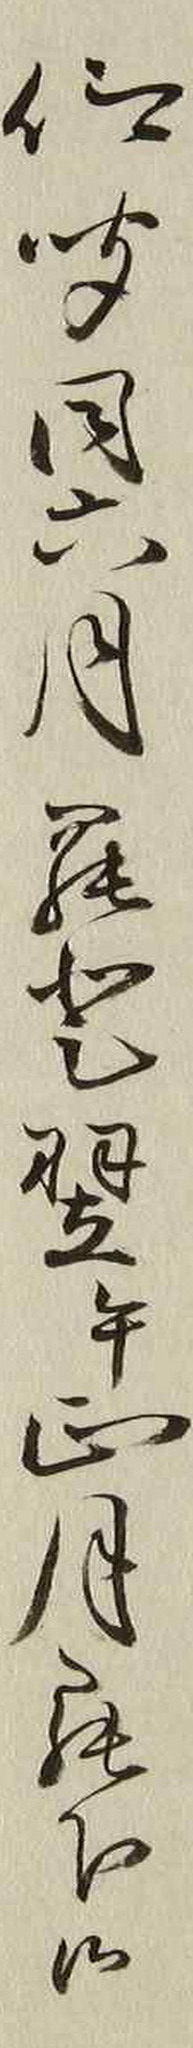仰聞同六月罷登翌午年正月罷下候
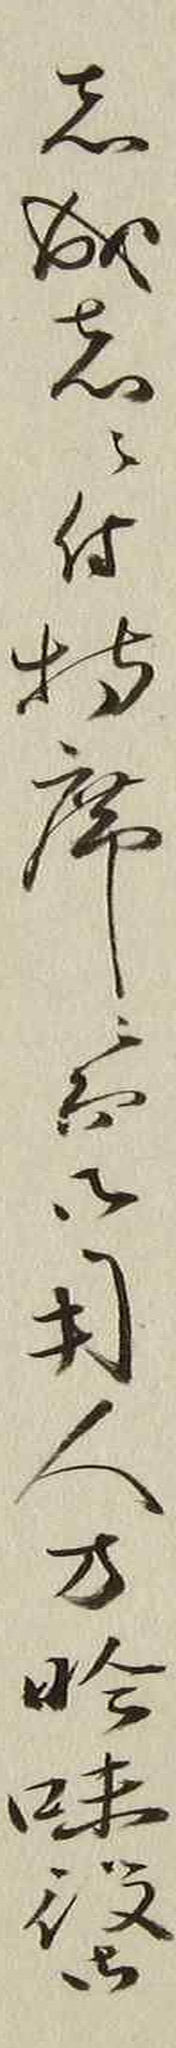者成者ニ付持席ニ而御用人方吟味役御
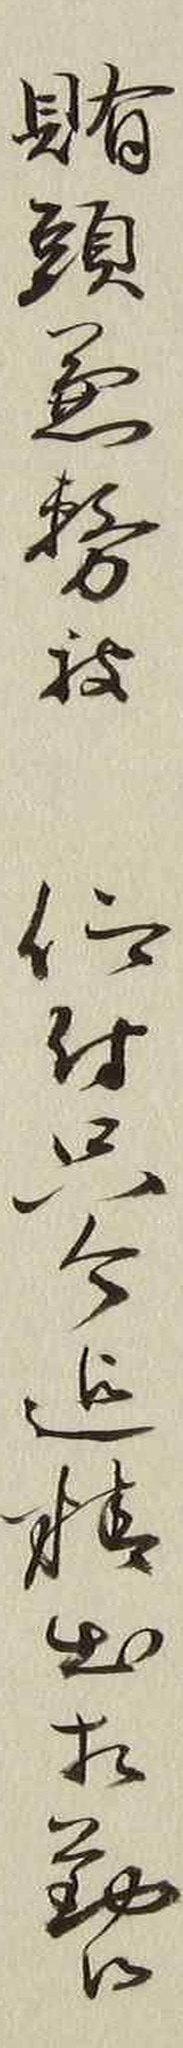賄頭兼務被仰付只今迄精出相勤候
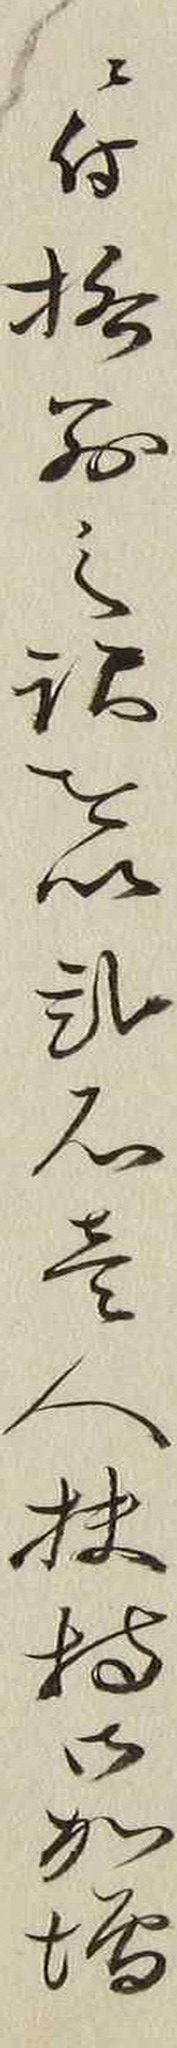ニ付格別之訳を以弐石壱人扶持御加増
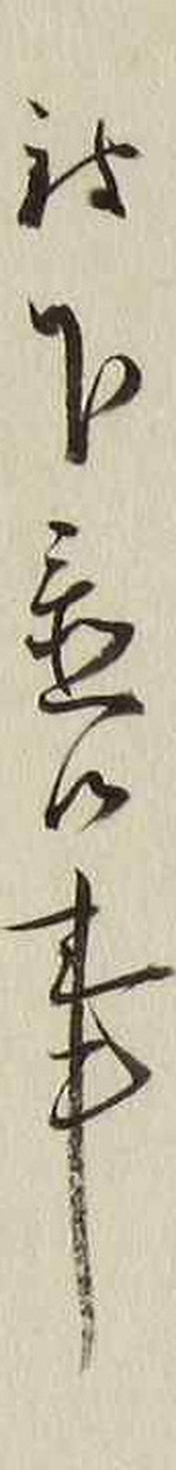被下置候事
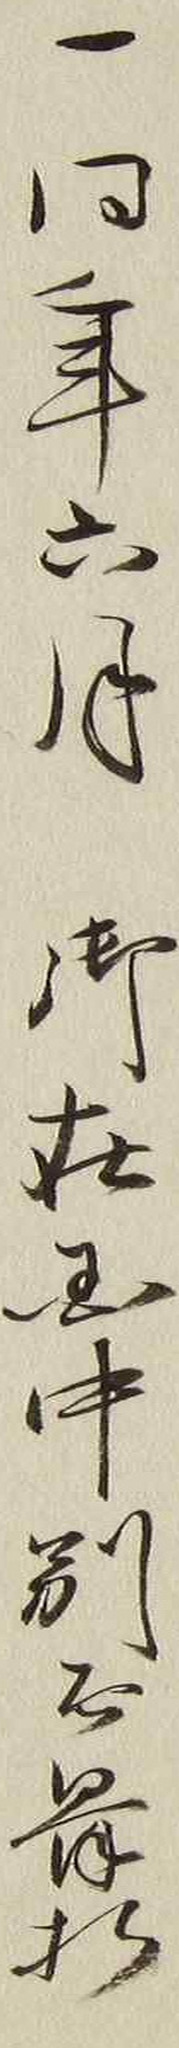一同年六月御在国中別而骨折
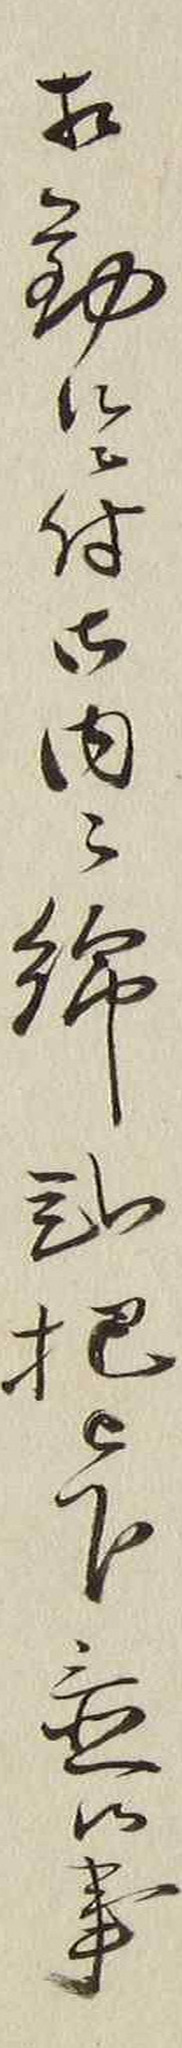相勤候ニ付御内々綿弐把被下置候事
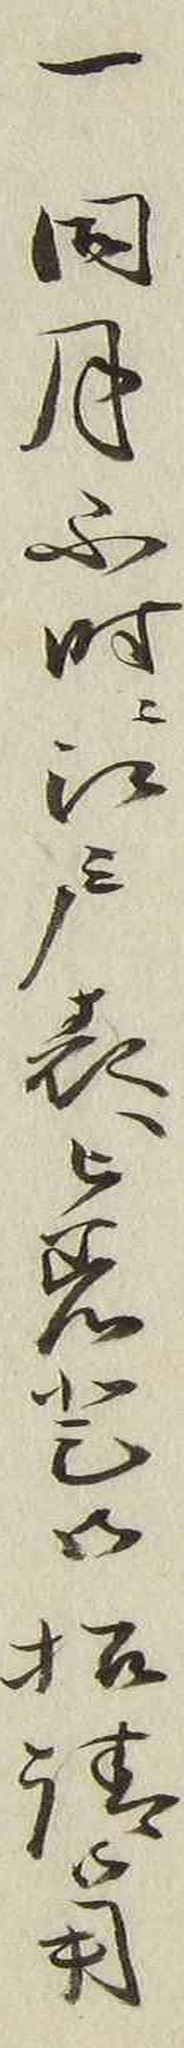一同月不時ニ江戸表ㇸ被差登御招請御用
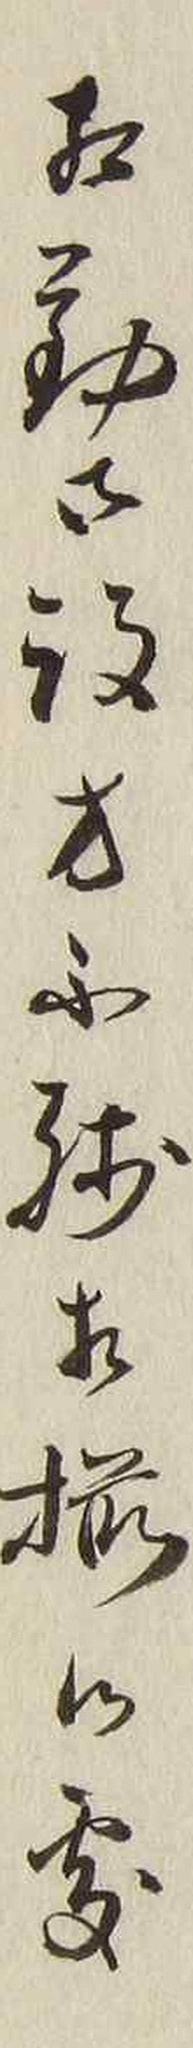相勤御設方不残相揃候処

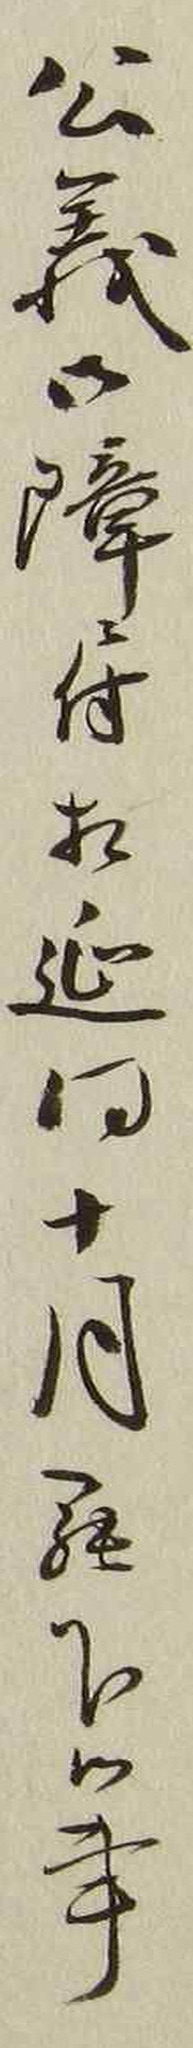公儀御障ニ付相延同十月罷下候事
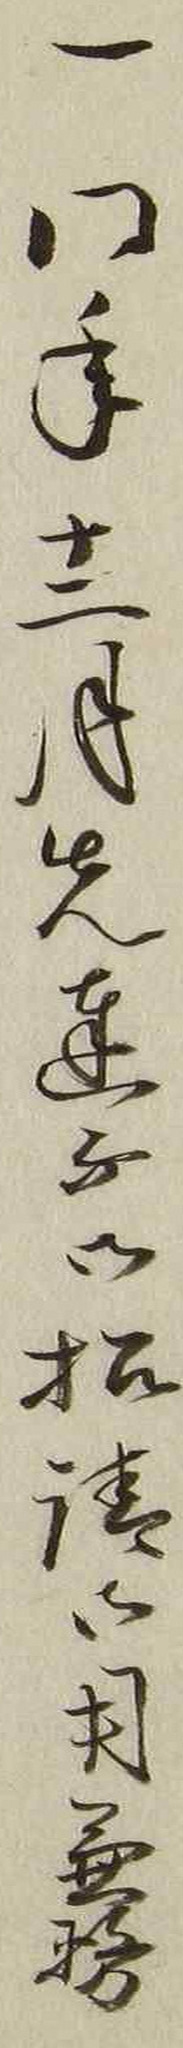一同年十二月先達而御招請御用兼務
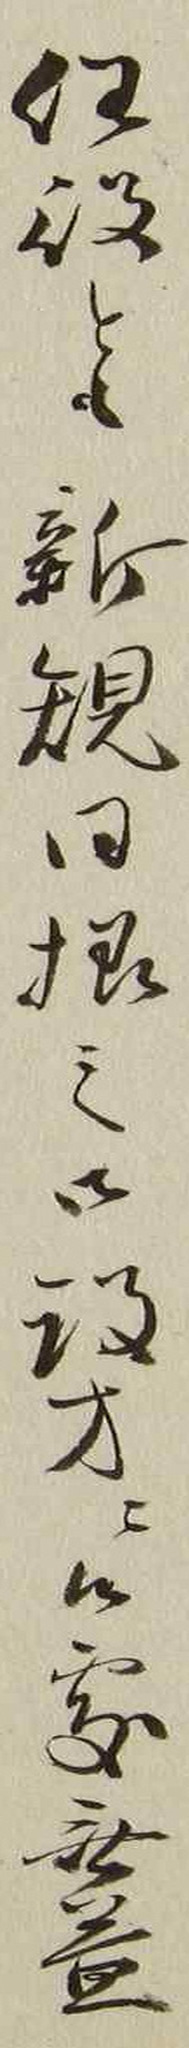任役とも新規同様之御設方ニ候処無益
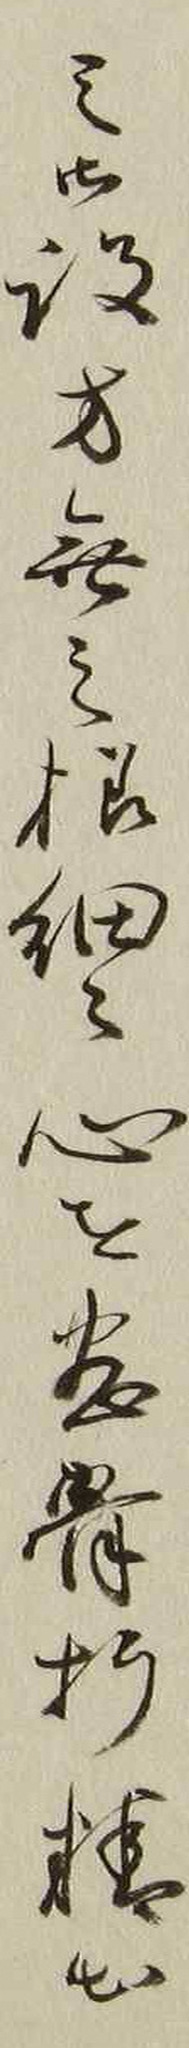之御設方無之様細々心を尽骨折精出
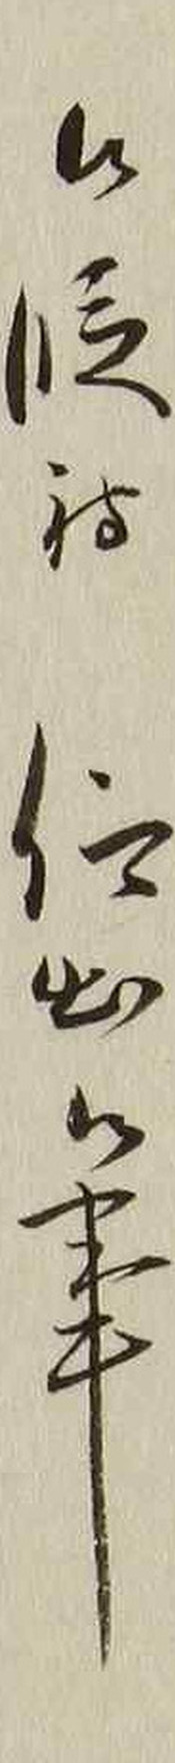候段被仰出候事
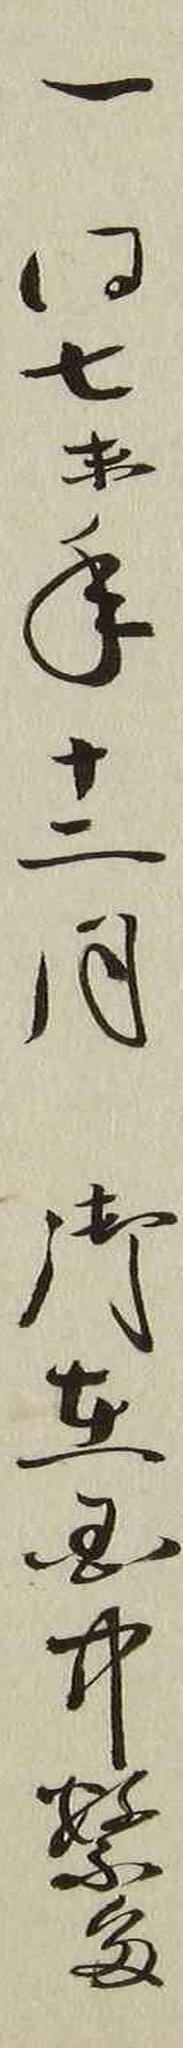一同七未年十二月御在国中繁多
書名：諸士系譜　巻之163　な之部5
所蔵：会津若松市立会津図書館
